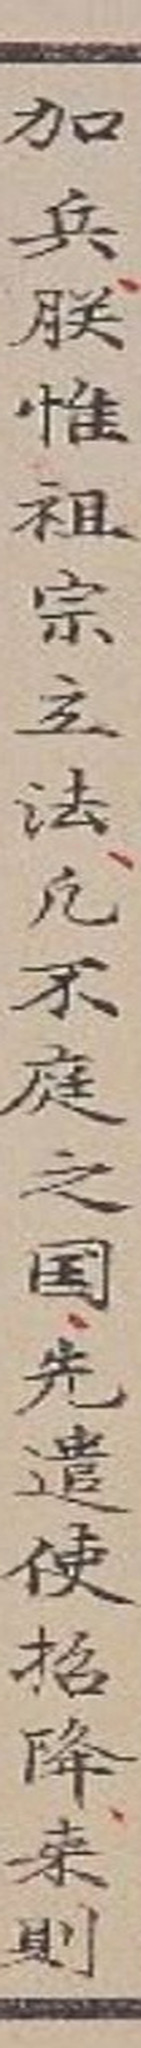加兵、朕惟祖宗立法、凡不庭之国、先遣使招降、来則
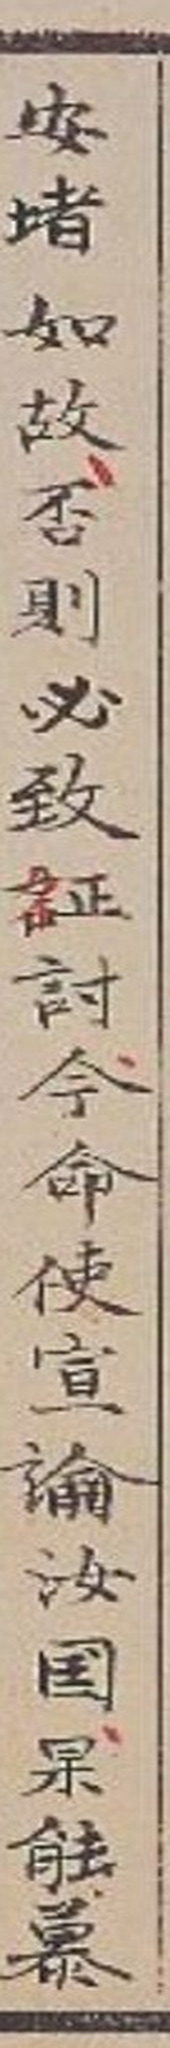安堵如故、否則必致証征討、今命使宣諭汝国、杲能慕
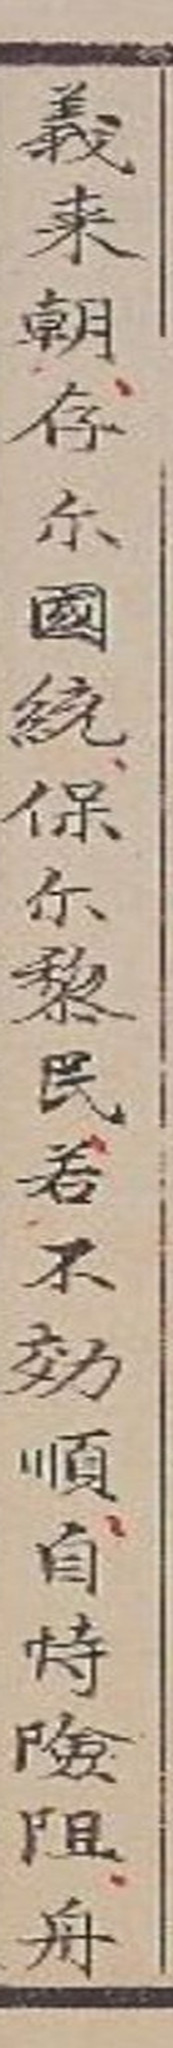義来朝、存爾国統、保爾黎民、若不効順、自恃険阻、舟
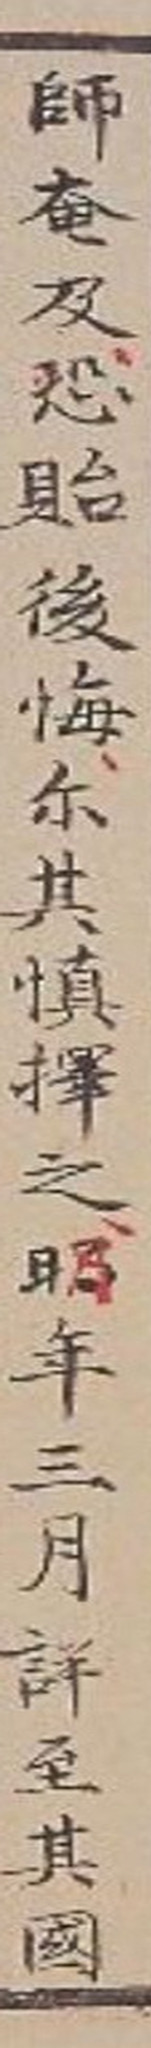師奄及、恐貽後悔、爾其慎択之、明年三月詳至其国
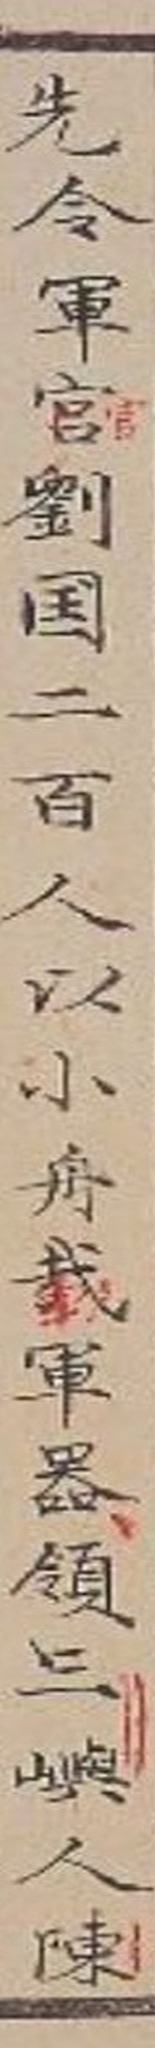先令軍宮官劉国二百人以小舟載軍器、領三嶼人陳
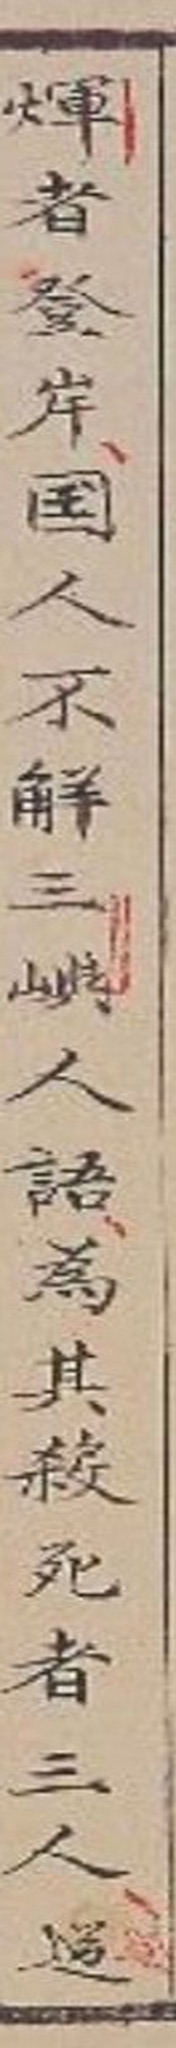煇者登岸、人不解三嶼人語、為其殺死者三人、遂
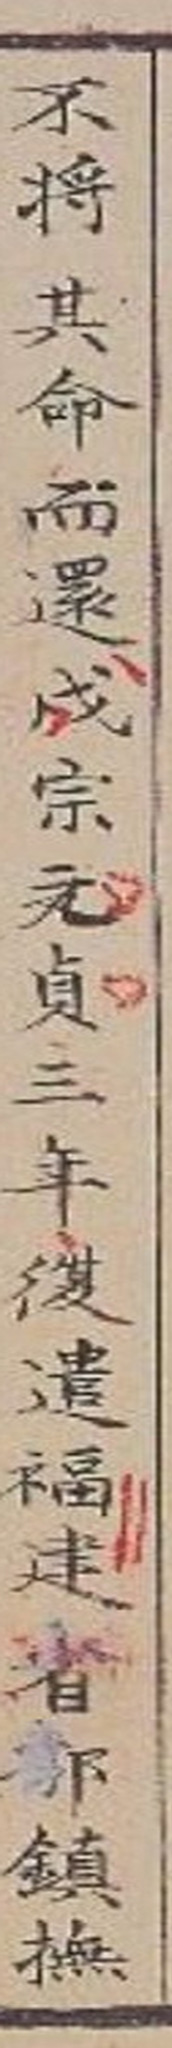不将其命而還、成宗元貞三年、復遣福建省都鎮撫
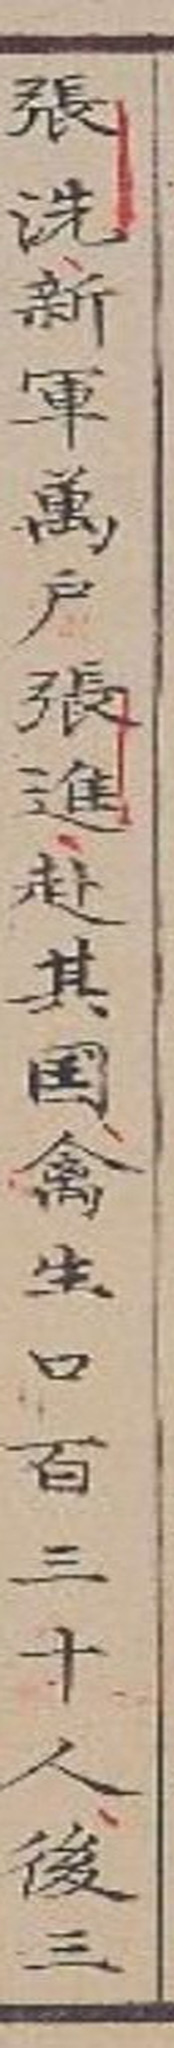張洗、新軍万戸張進、赴其国、禽生口百三十人、後三
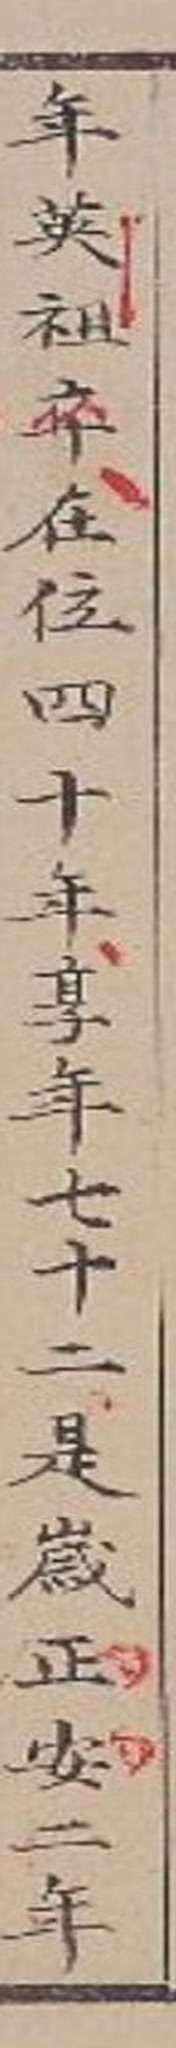年英祖卒、在位四十年、享年七十二、是歳正安二年
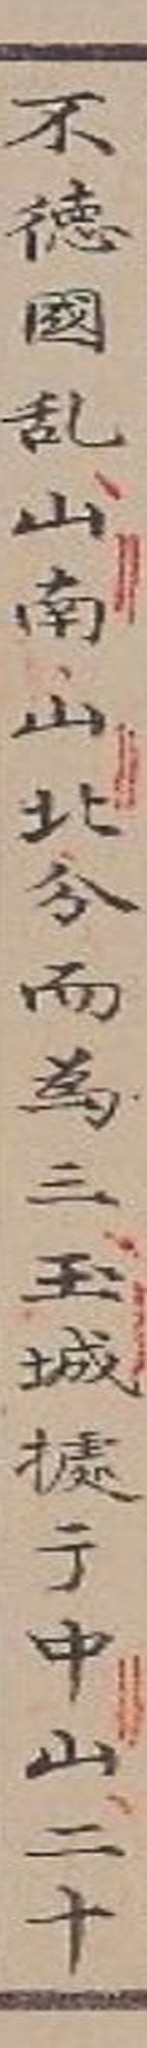不徳国乱、山南・山北分而為三、玉城拠于中山、二十

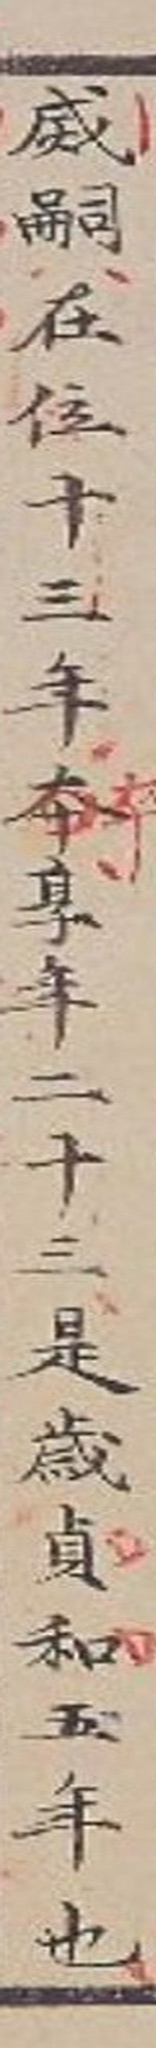烕嗣、在位十三年夲卒、享年二十三、是歳貞和五年也、
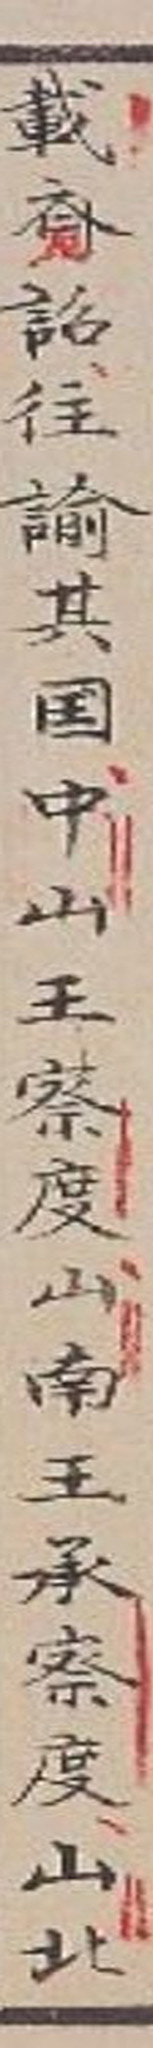載斉詔、往諭其国、中山王察度、山南王承察度、山北
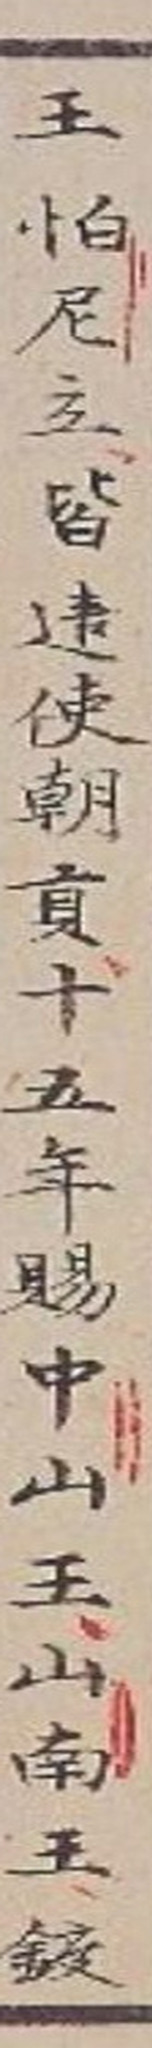王怕尼立、皆遣使朝貢、十五年賜中山王、山南王鍍
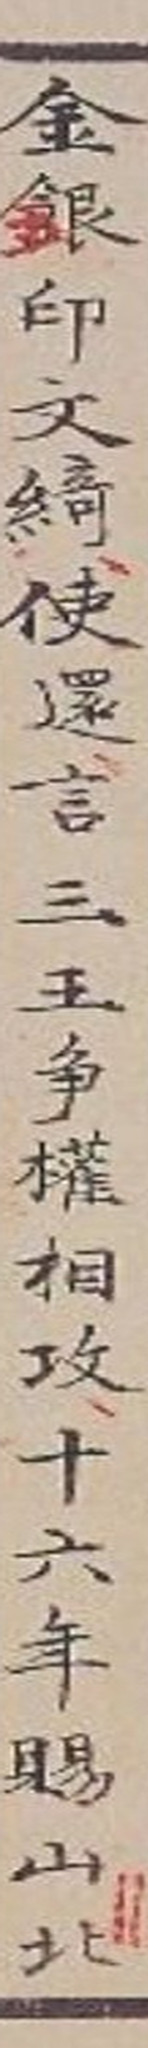金銀印文綺、使還言三王争権相攻、十六年賜山北
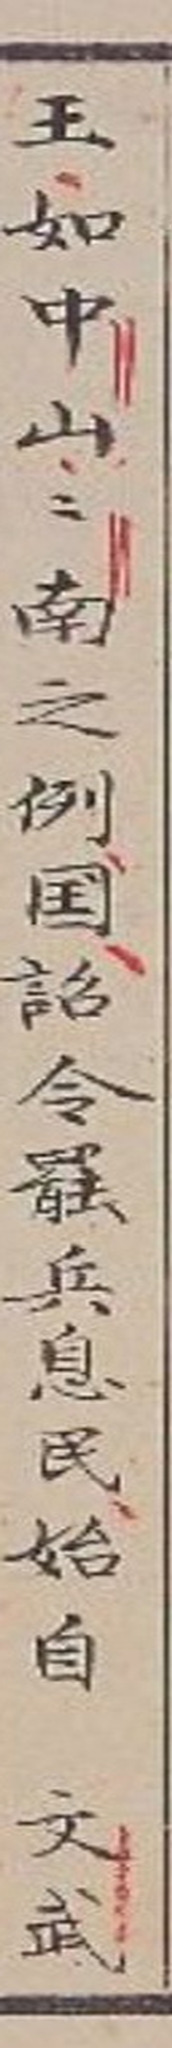王、如中山々南之例、国、詔令罷兵息民、始自文武
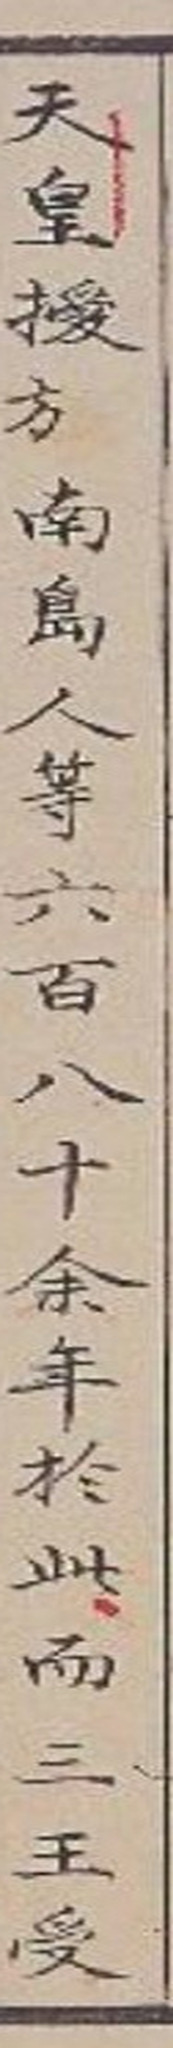天皇授方南島人等六百八十余年於此、而三王受
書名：南島志 全
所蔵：University of the Ryukyus Library
